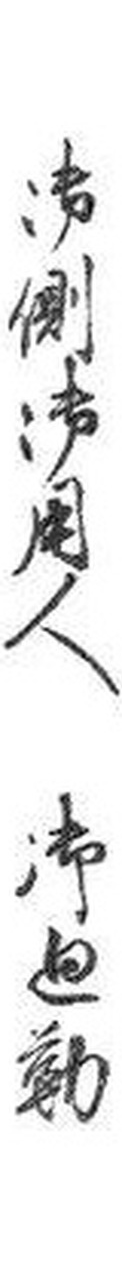御側御用人御廻勤
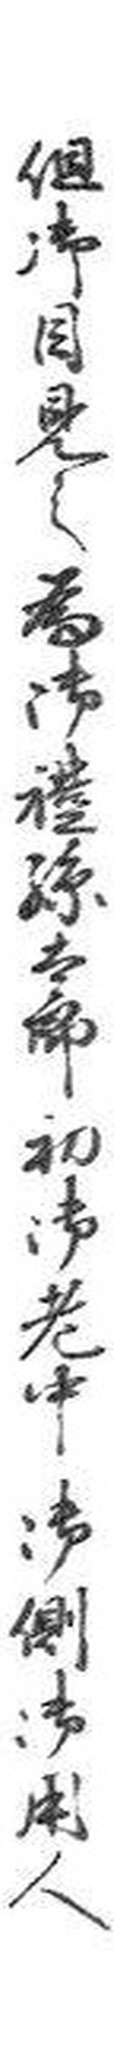但御目見之為御礼孫太郎初御老中御側御用人
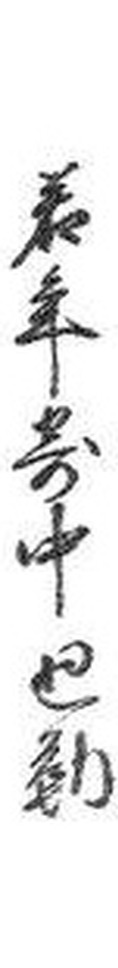若年寄中廻勤
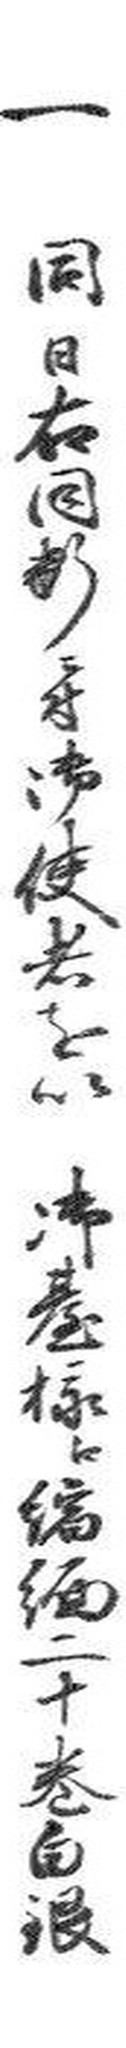一同日右同断ニ付御使者を以御台様江縮緬二十巻白銀
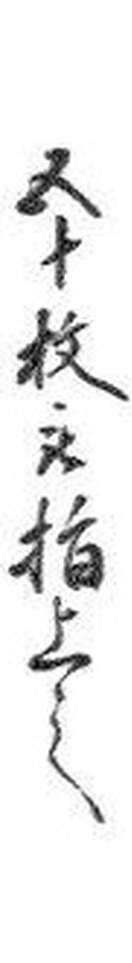五十枚被指上之
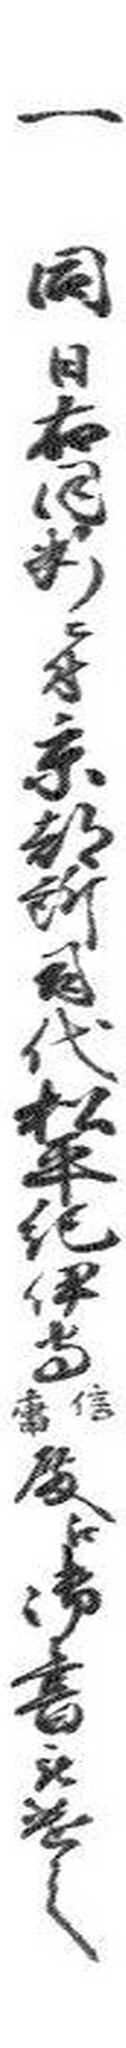一同日右同断ニ付京都所司代松平紀伊守信庸殿江御書被遣之
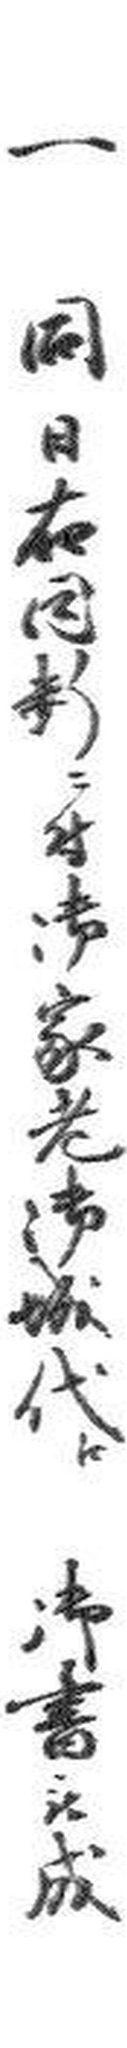一同日右同断ニ付御家老御城代江御書被成
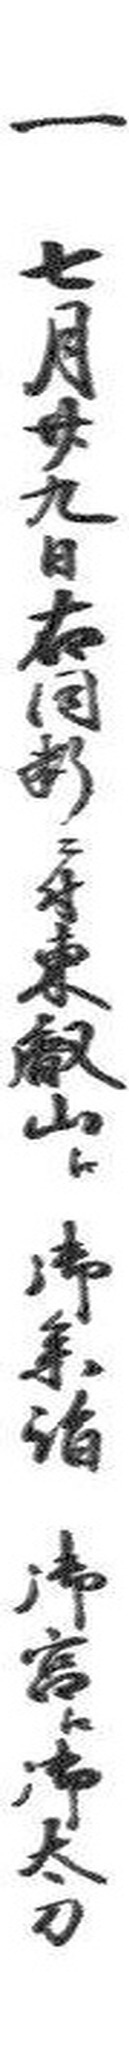一七月廿九日右同断ニ付東叡山江御参詣御宮江御太刀
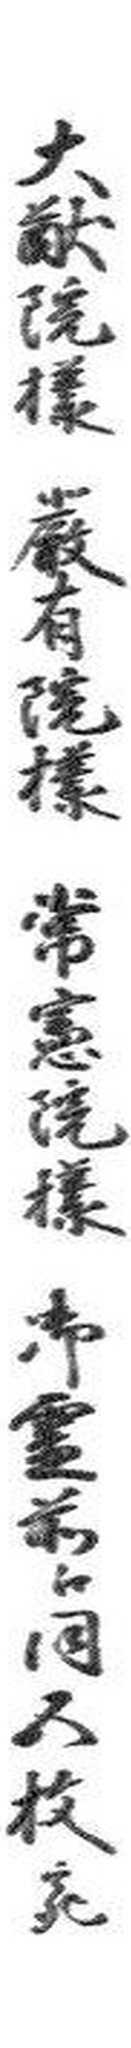大猷院様厳有院様常憲院様御霊前江同五枚宛
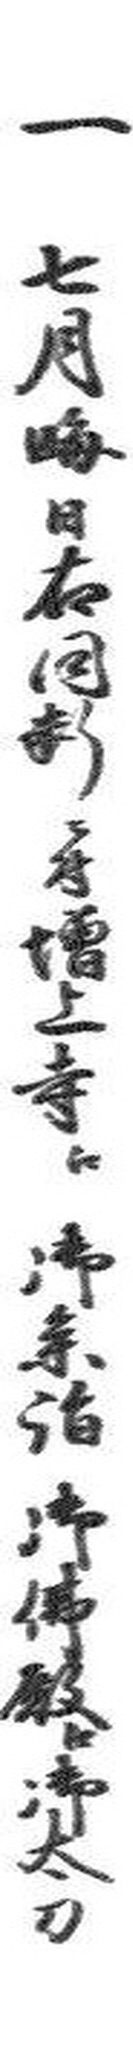一七月晦日右同断ニ付増上寺江御参詣御仏殿江御太刀
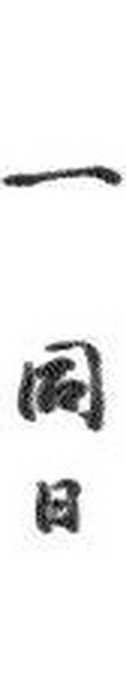一同日
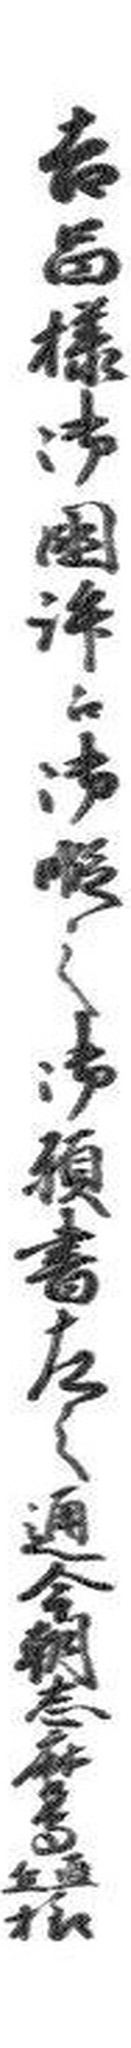吉品様御国許江御暇之御願書左之通今朝志摩守直丘様

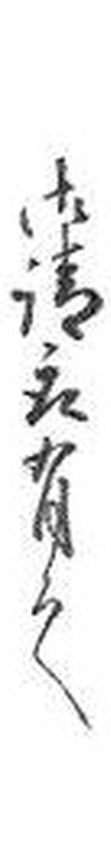御請取有之
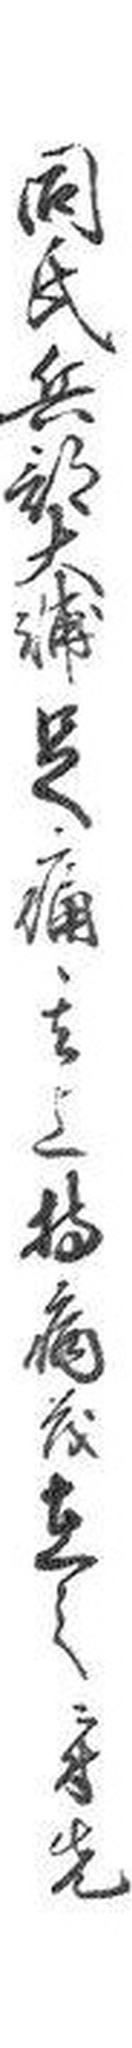同氏兵部大輔足痛其上持病茂在之ニ付先
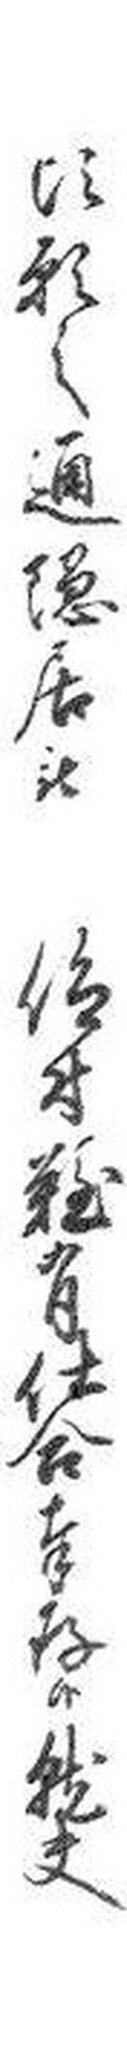頃願之通隠居被仰付難有仕合奉存候就夫
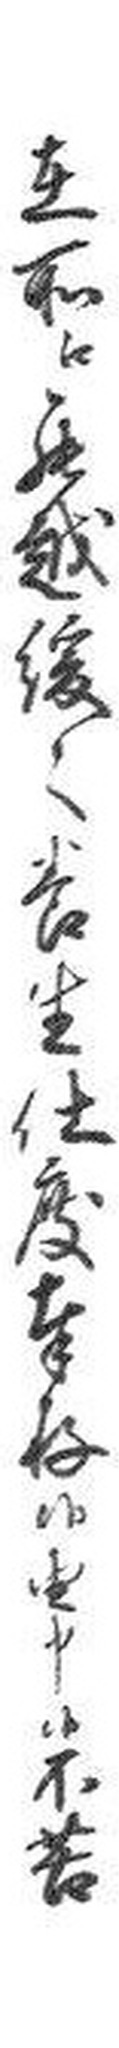在所江罷越緩々養生仕度奉存候由申候不苦
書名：家譜 二十八 吉邦公 従宝永七年七月五日到正徳元年十二月
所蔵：福井県文書館 Fukui Prefectural Archives
